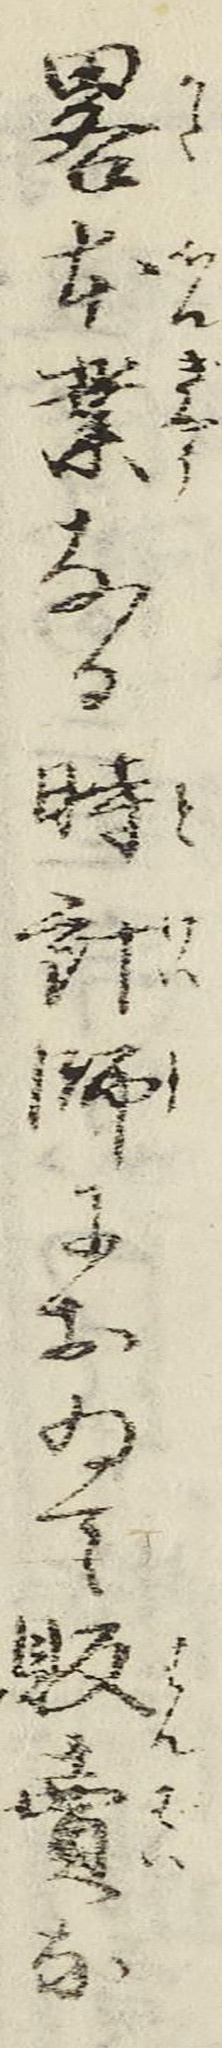略本業なる時計師におゐて販売な
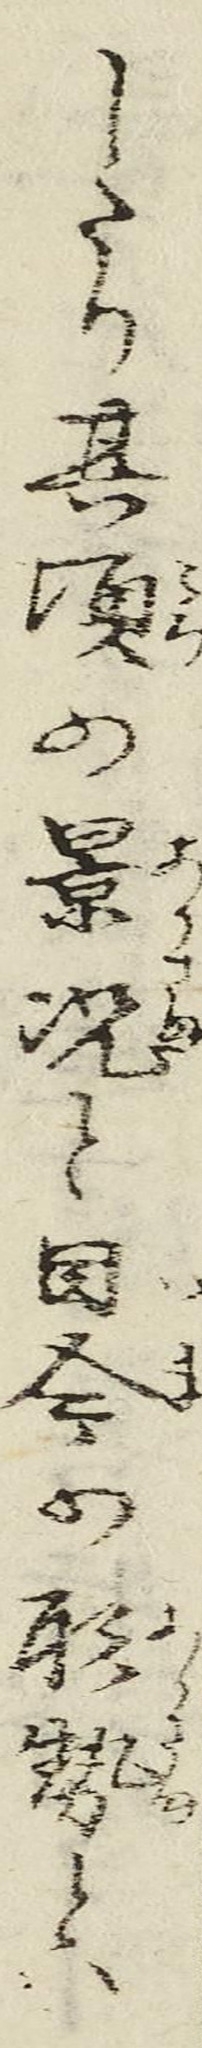したり其頃の景況と目今の形勢とは
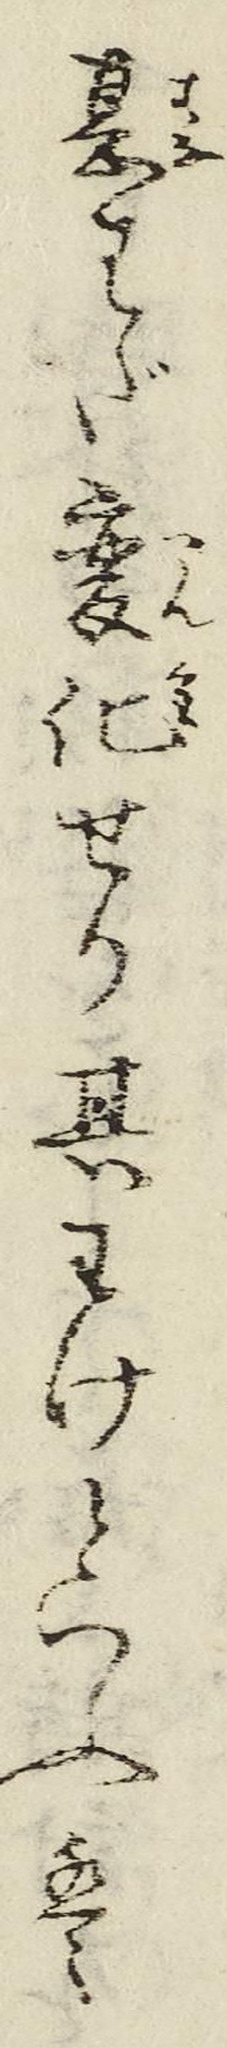甚はだ変化せり其わけといふは
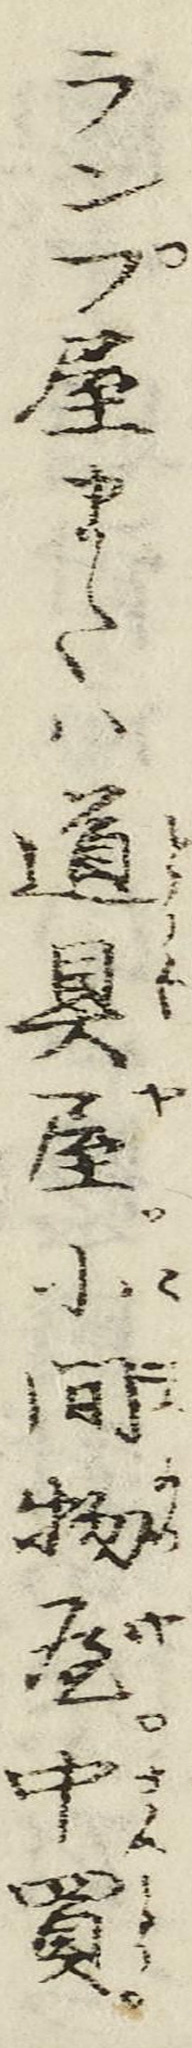ランプ屋または道具屋。小間物屋。中買。
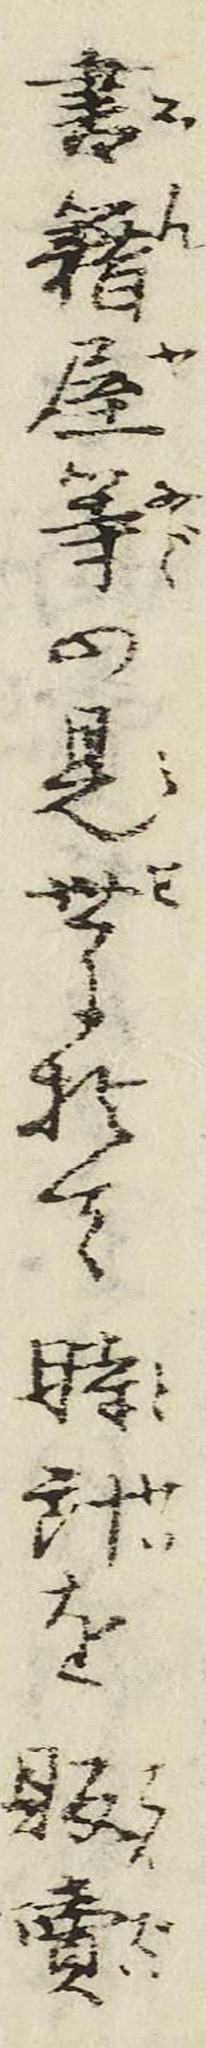書籍屋等の見世に於て時計を販売
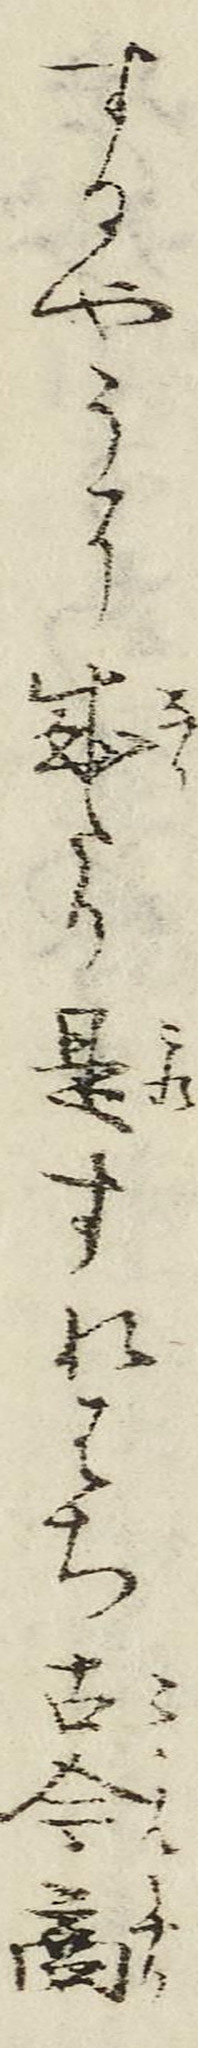するやうに成たり是すなはち古今商
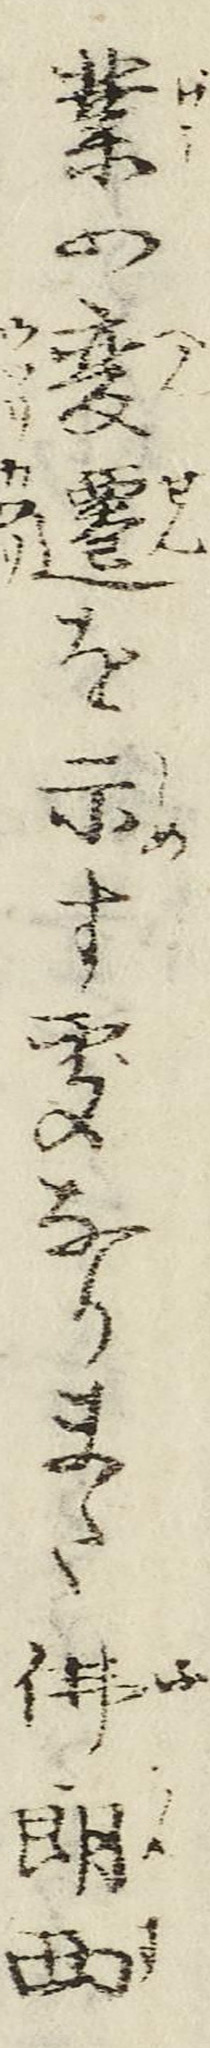業の変遷を示す処なりまた佛朗西
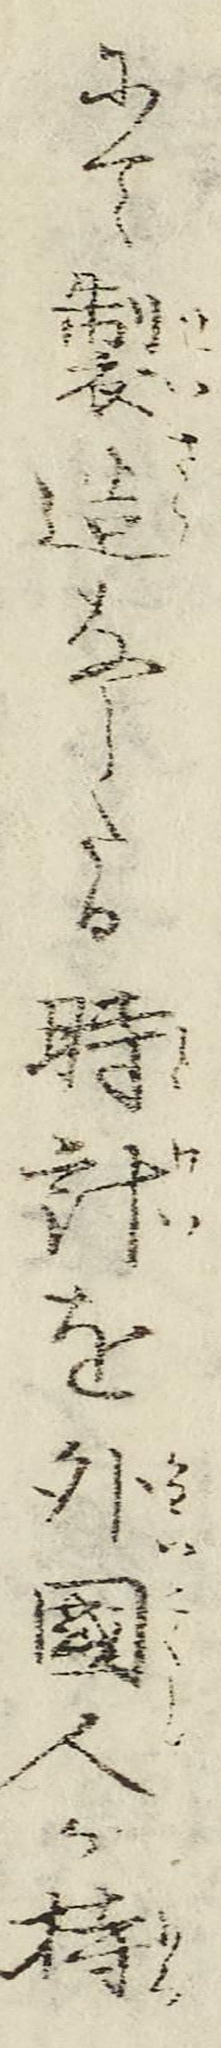にて製造なしたる時計を外国人か持
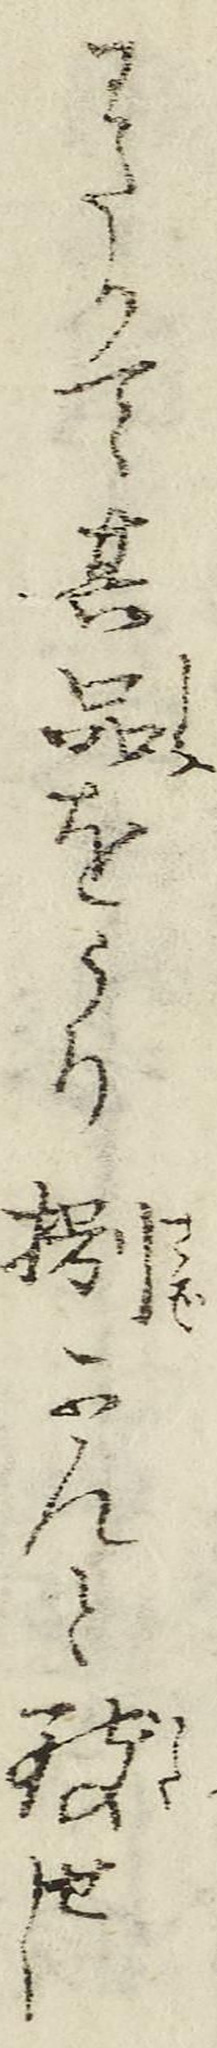わたりて其品をうり捌かんと致せし
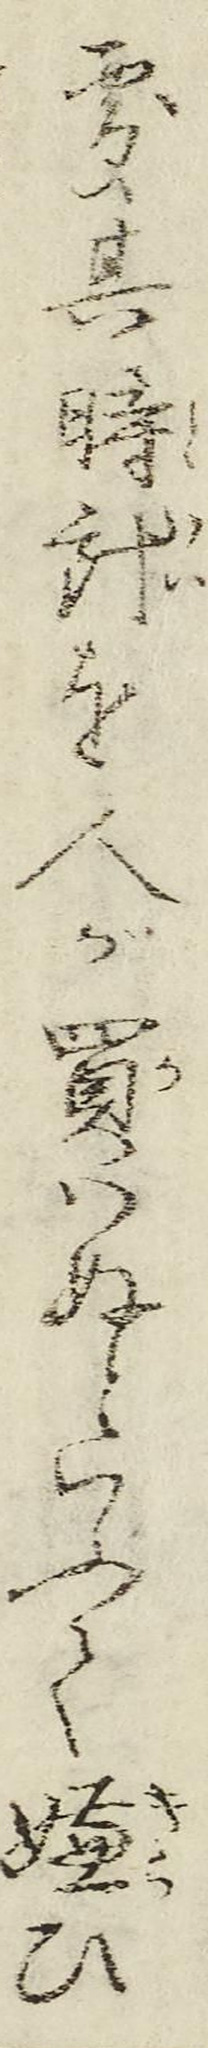処其時計を人が買はぬといふて嫌ひ
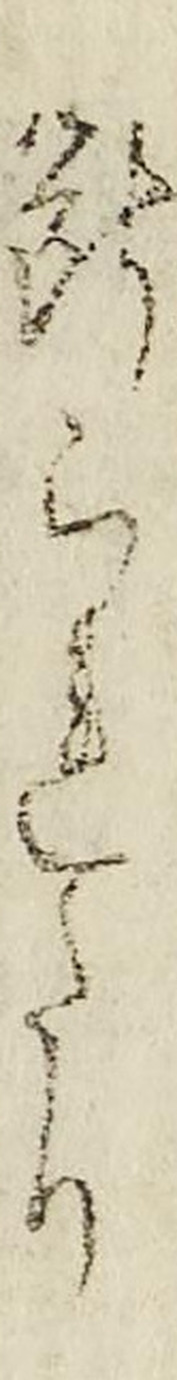断られたり

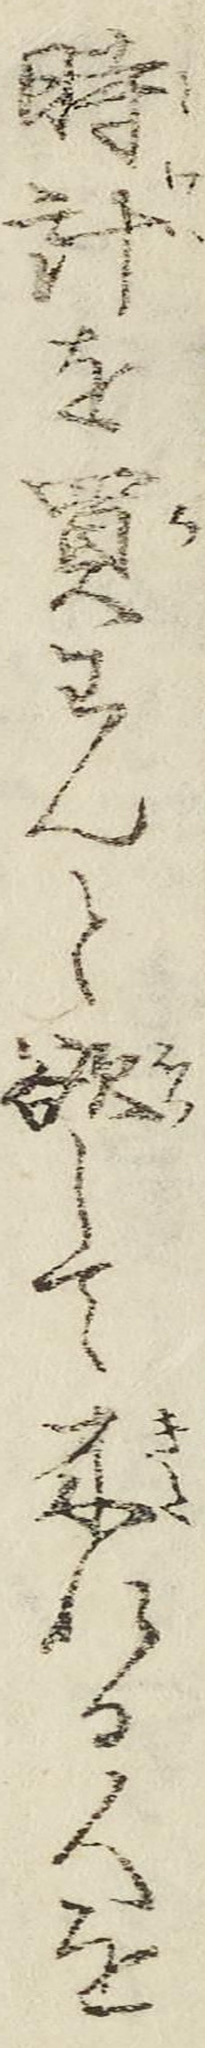時計を買わんと欲して来れる人を
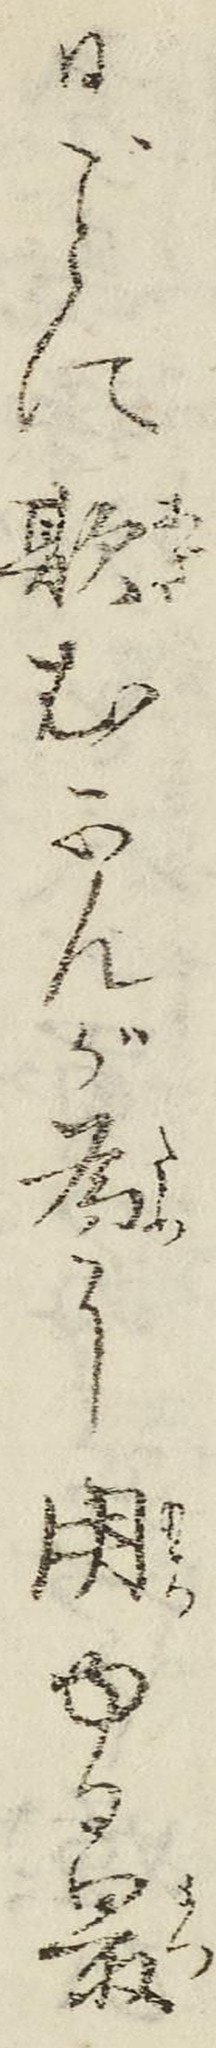日ごとに欺むかんが為に用ゆる最
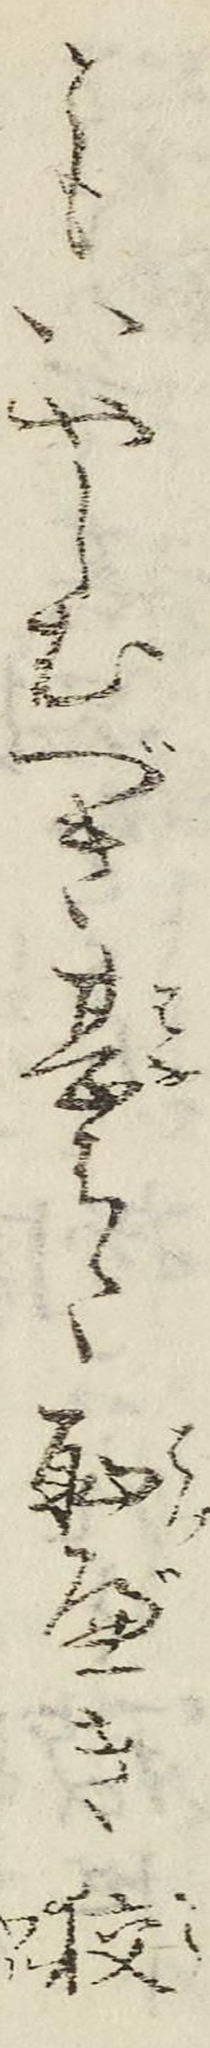ともいやしむべき甚はた恥べき狡
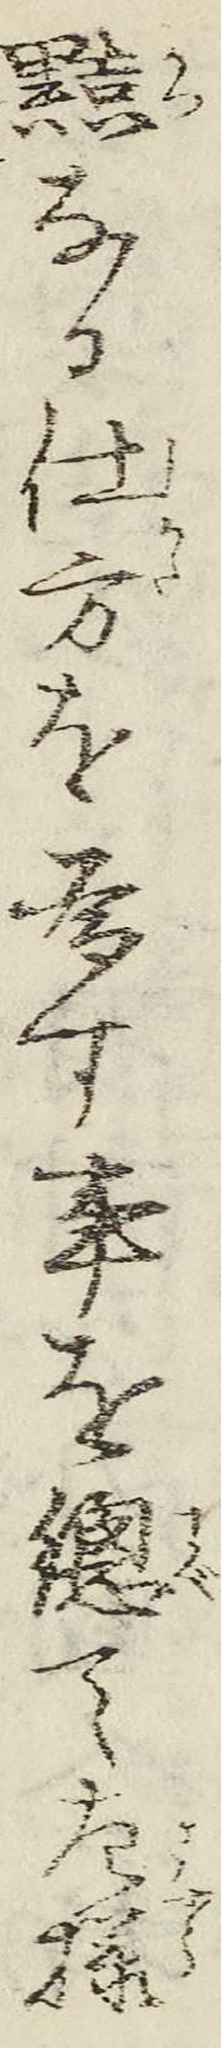黠なる仕方を為す事を総て左様
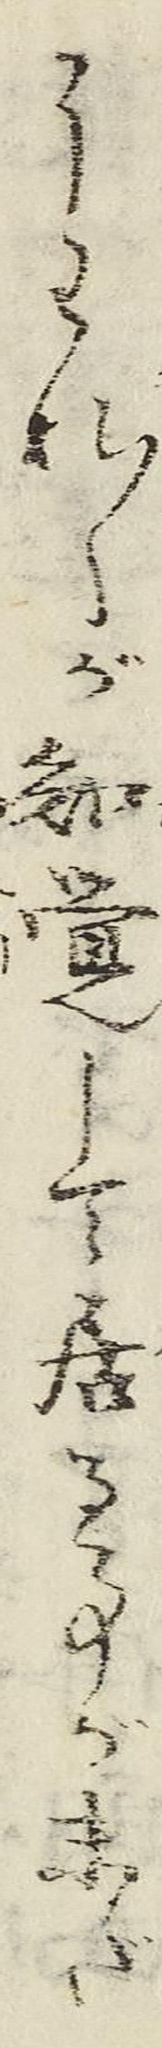にわれ〳〵が知覚して居る事が未た
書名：[時計に関する冊子]
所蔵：東京大学地震研究所図書室 Earthquake Research Institute Library, The University of Tokyo, JAPAN
